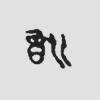訓
